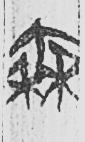秦
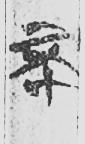不
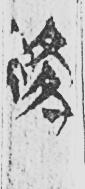降
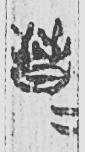晉=
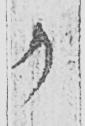人
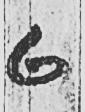㠯（以）
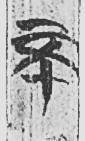不
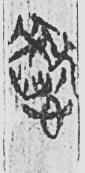憖
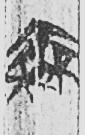秦
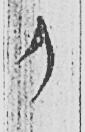人
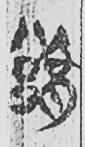豫
